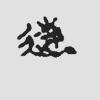𨓹
